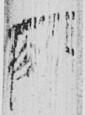所
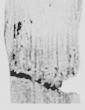亞（惡）
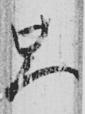也
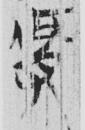貴
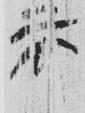而
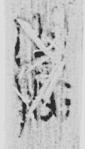能
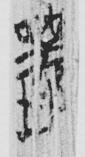壤（讓）
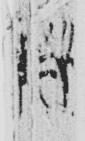斯
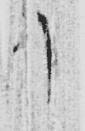人
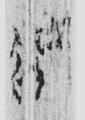欲
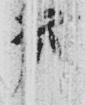亓（其）
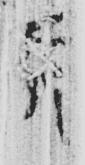長
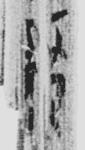貴
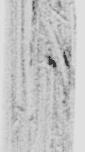也
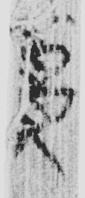富
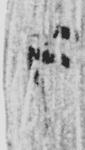而
